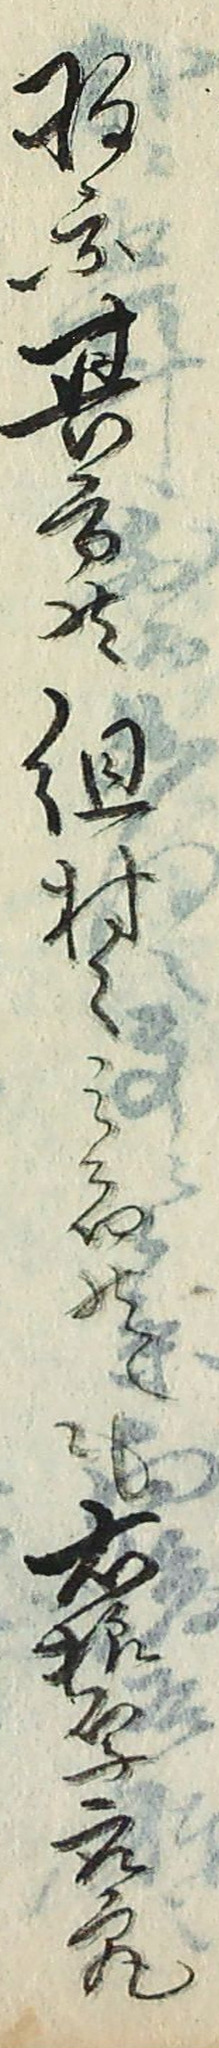将亦其方共組村々之者共へも右様厚取究
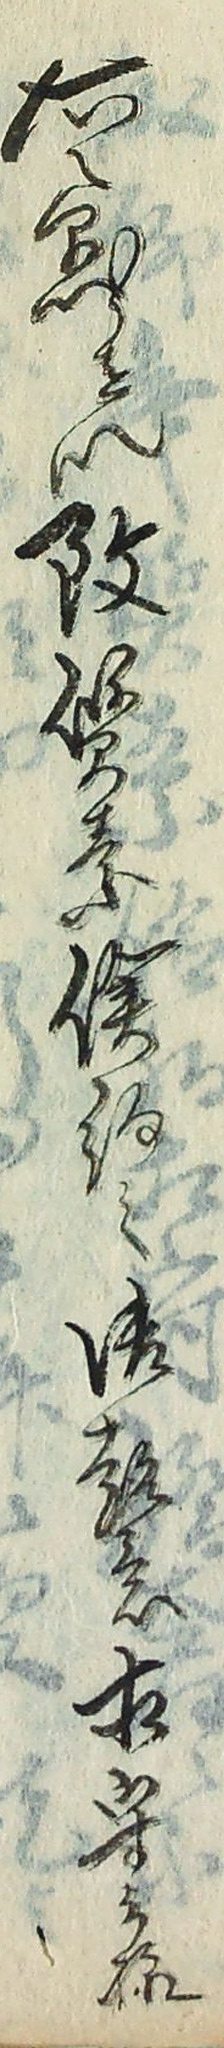右之懸りを以改質素倹約之御趣意相守候様
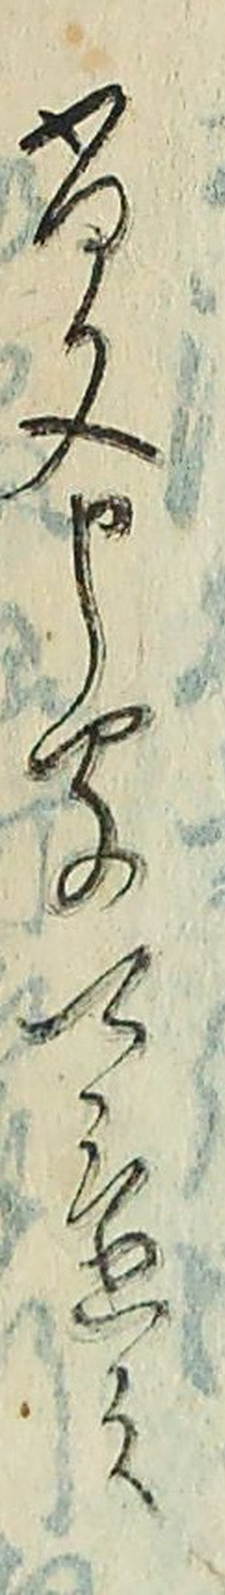尚亦申聞可置候
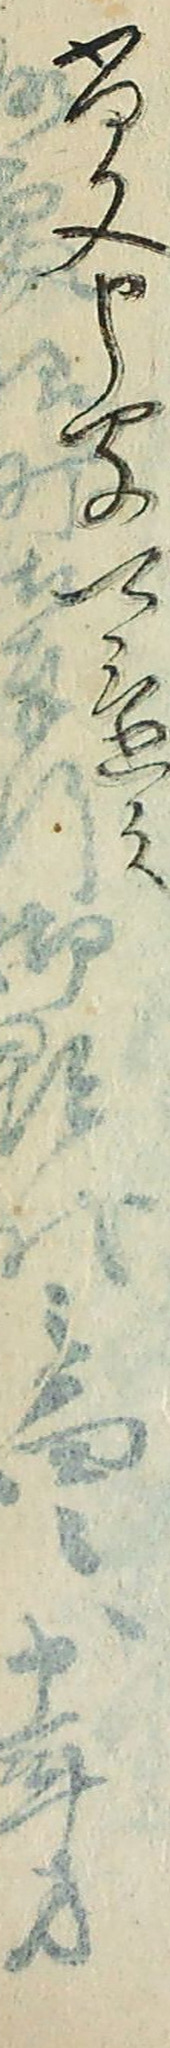尚亦申聞可置候
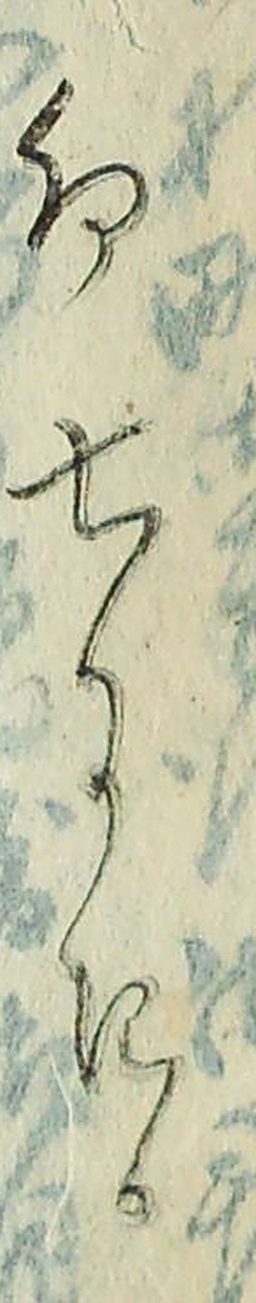卯七月四日

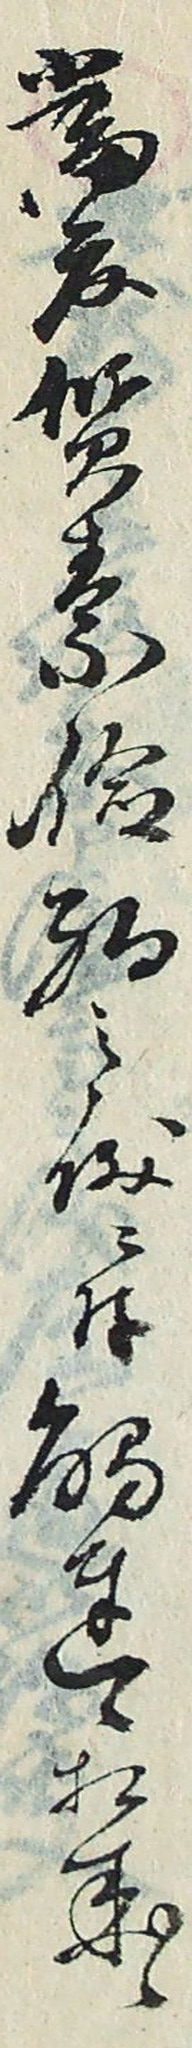當夏質素倹約之儀ニ付觸達ニ相成候
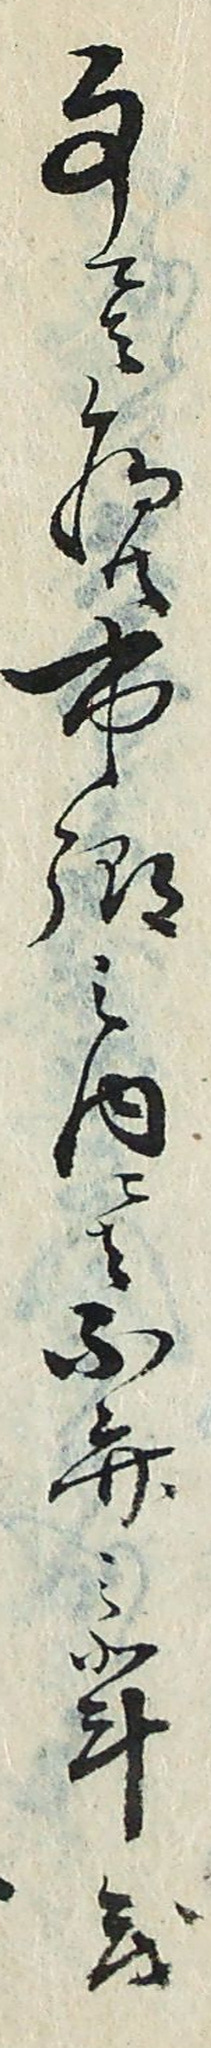事ニ候者候得共市郷之内ニ者不弁之輩も
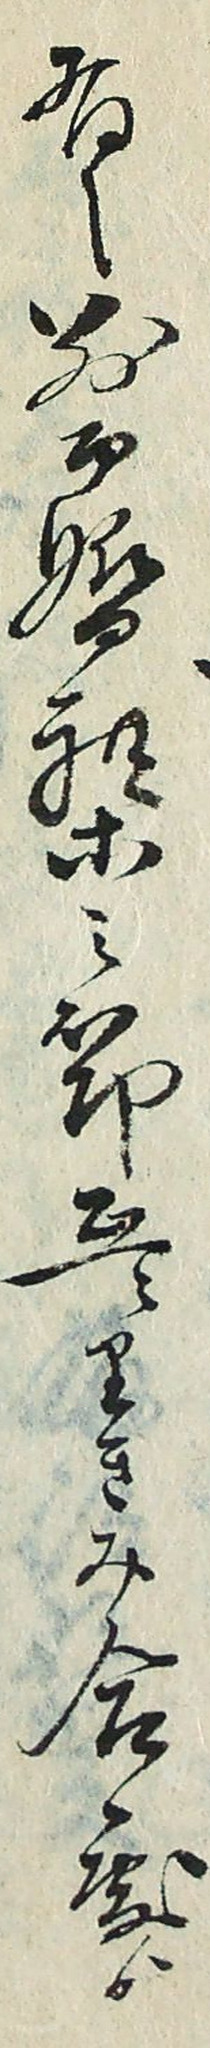有之別而婚禮等之節互ニりきみ合候處ゟ
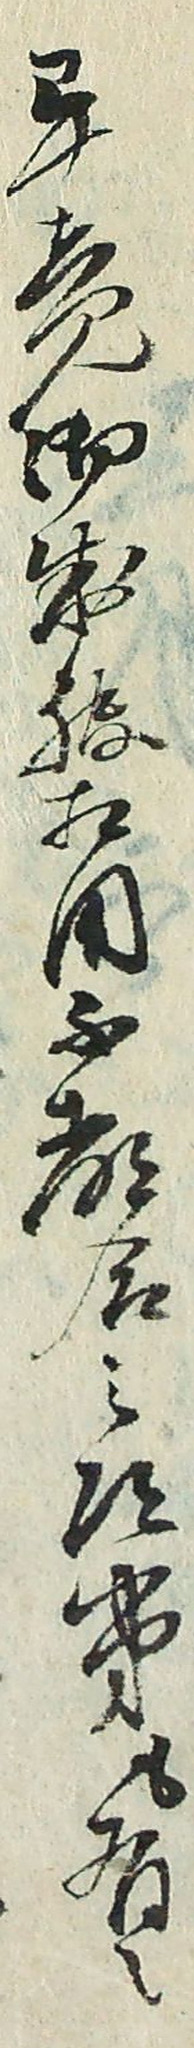畢竟御制服相用不都合之次第も有之
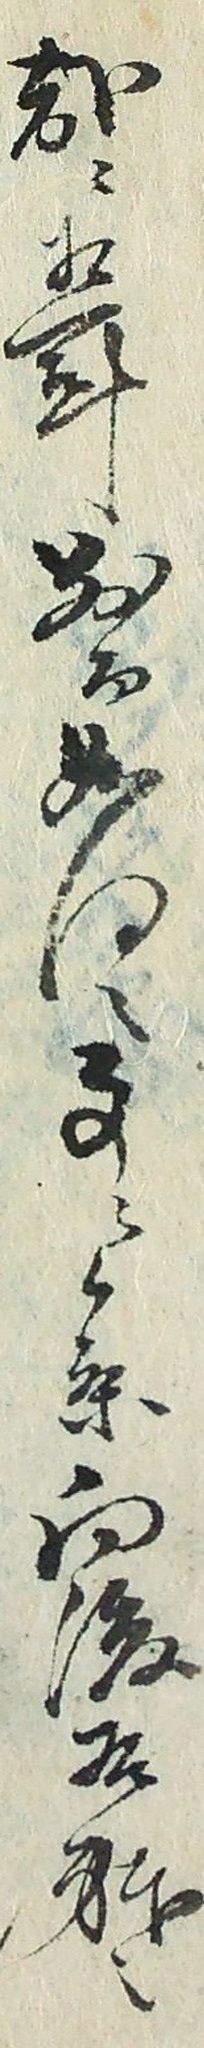哉ニ相聞別而如何之事ニ候条向後右躰之
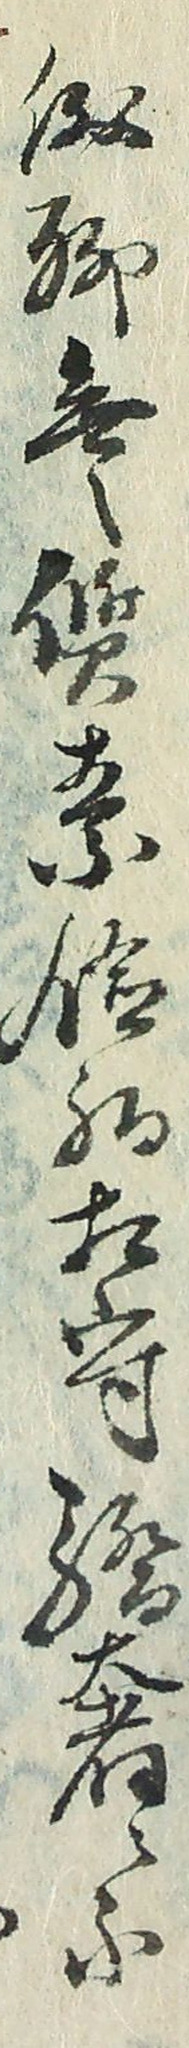儀聊無之質素倹約相守驕奢ニ不
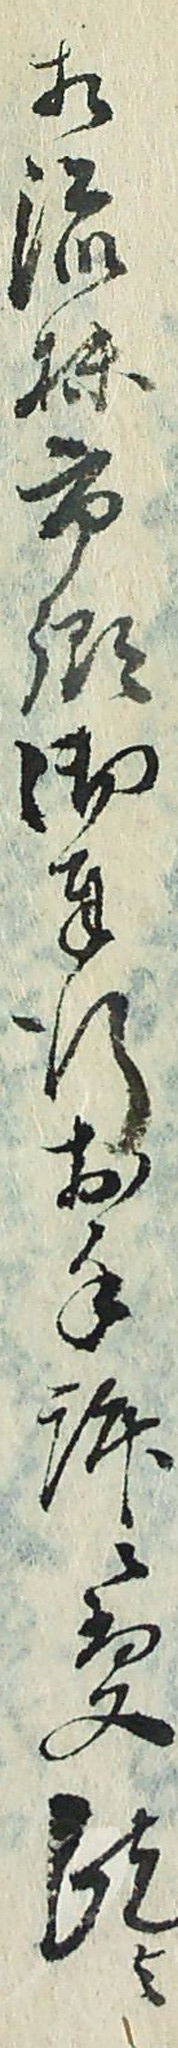相流抹市郷御奉行於手許ニ尚又屹と
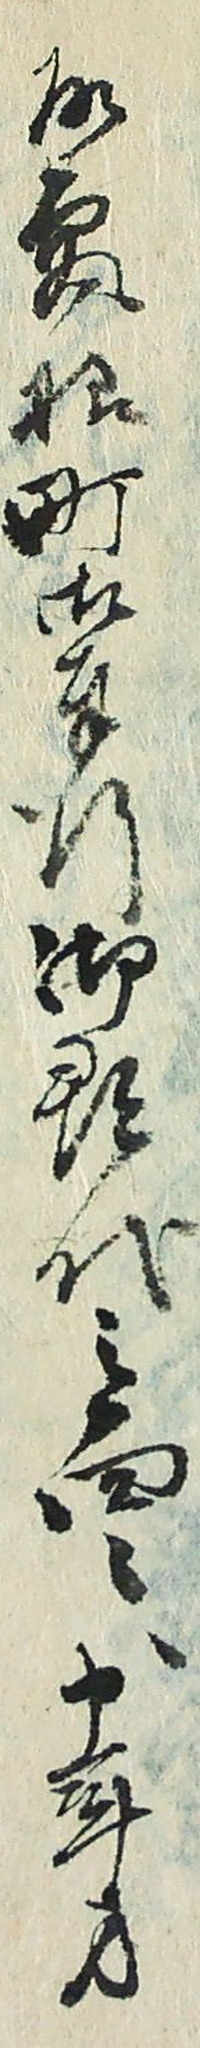取究様町御奉行御郡代之面々へ申聞方
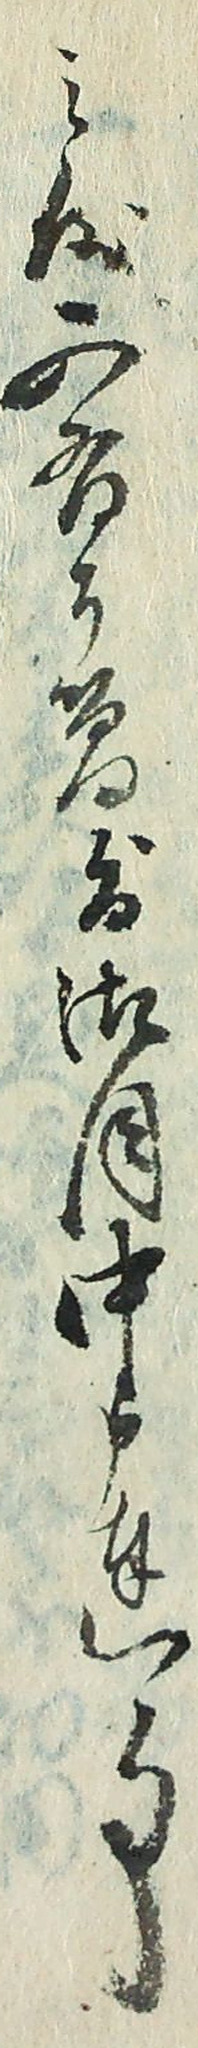之儀可有了簡旨御月中申達候事
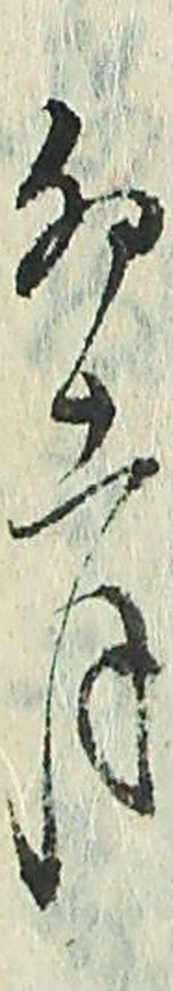卯十一月
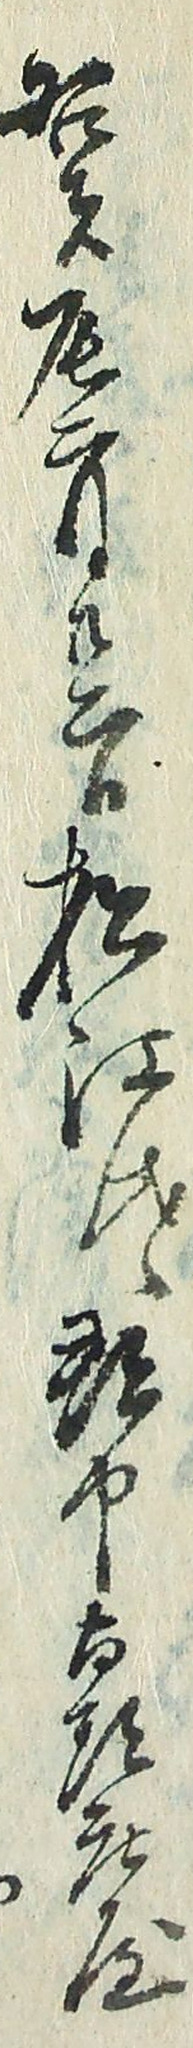右者辰二月廿二日松江氏へ郡中与頭庄屋
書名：諸御趣意書并御下知向之写
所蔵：鳴門教育大学 Naruto University of Education
